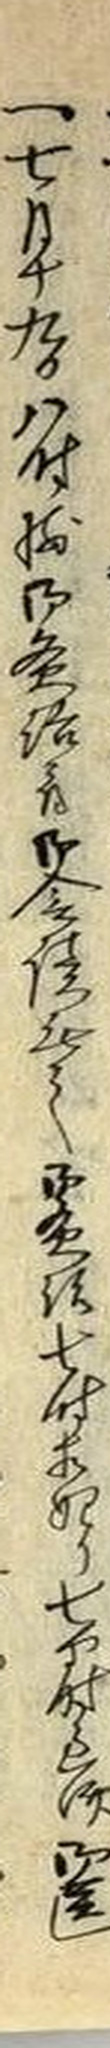一七月十九日八時揃御灸治ニ付御会読無之御灸治七時相始り七半時過済御医
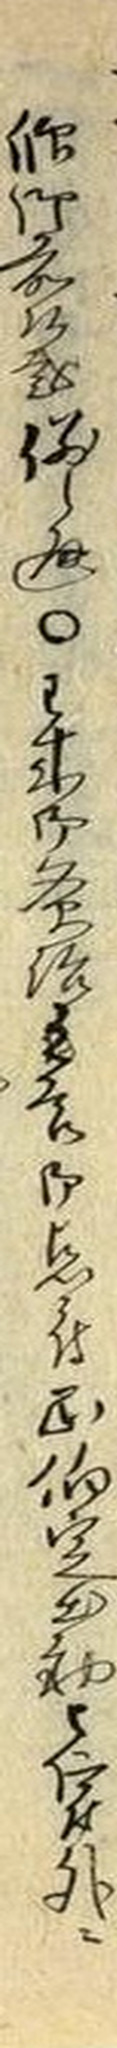師御前頂戴例之通○已来御灸治之節御点ニ付正伯定出勤被仰付外ニ
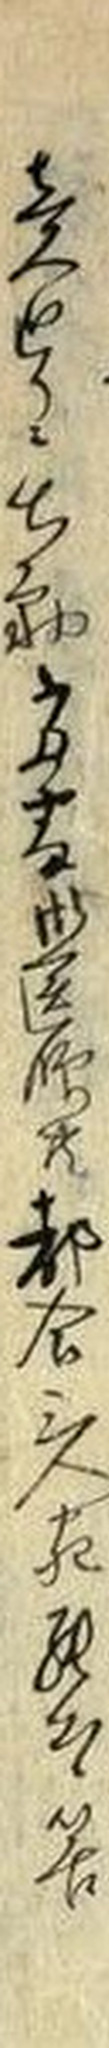壱人廻りニ出勤当番御医師共都合三人宛罷出候筈
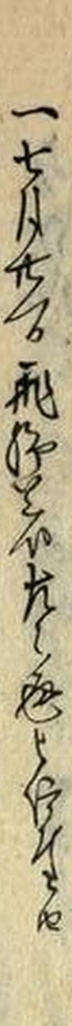一七月廿一日飛脚着左之通被仰付候由
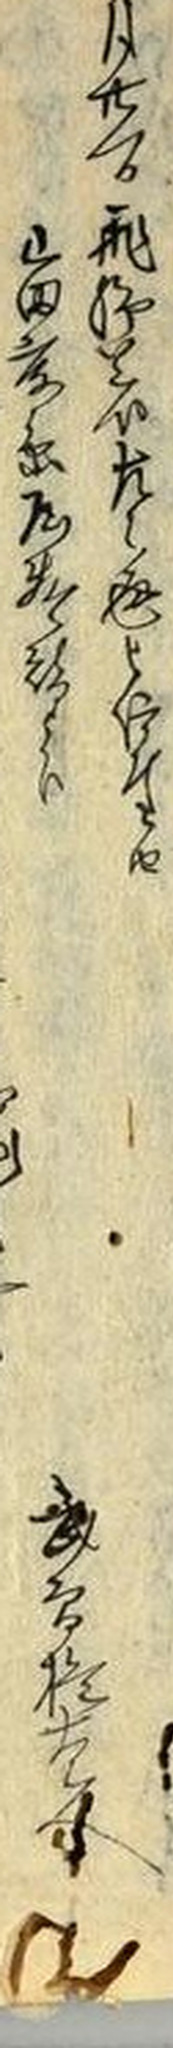山田藤兵衛屋敷替被下武曾権太夫
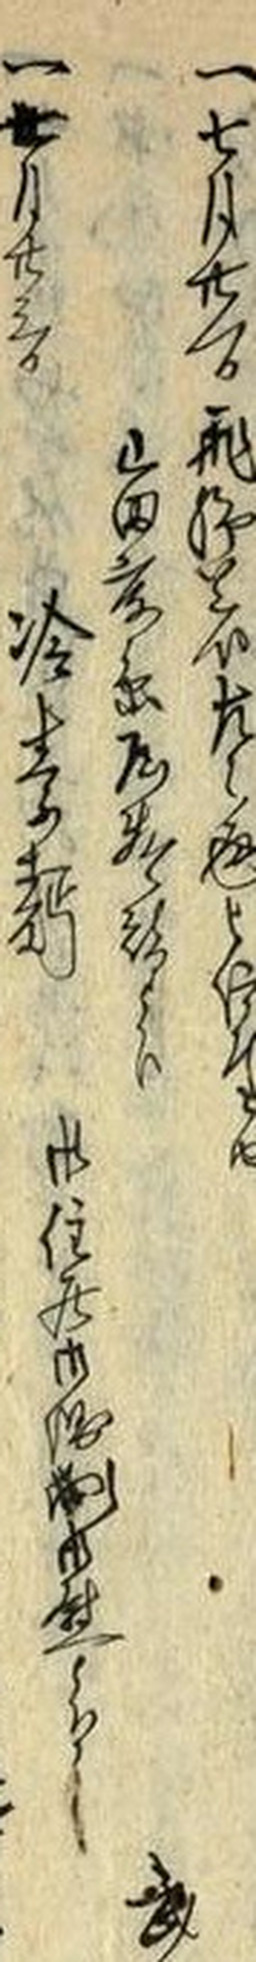一七月廿三日冷素麺御住居御側御慰被下之
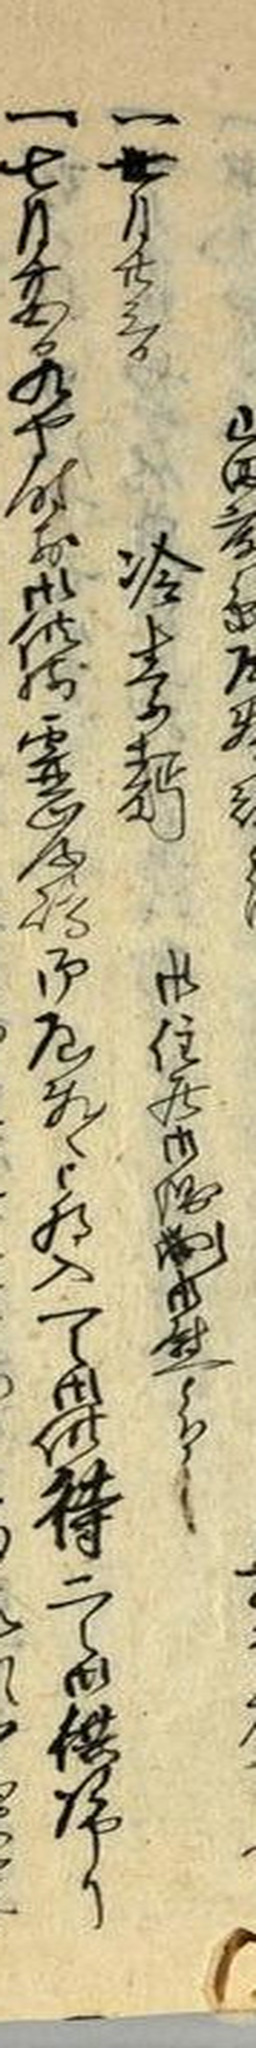一七月廿五日九半時前御供揃霊岸嶋御屋敷へ被為入一之御供待二之御供帰り
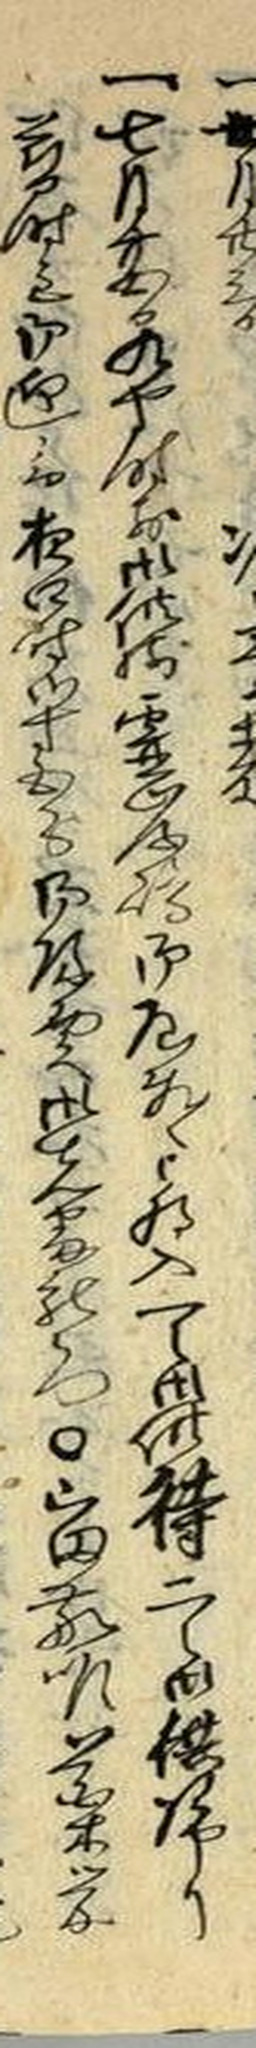暮時過御迎ニ而夜四時弐寸五分御帰殿御先番新右衛門○山田敬順花木栄
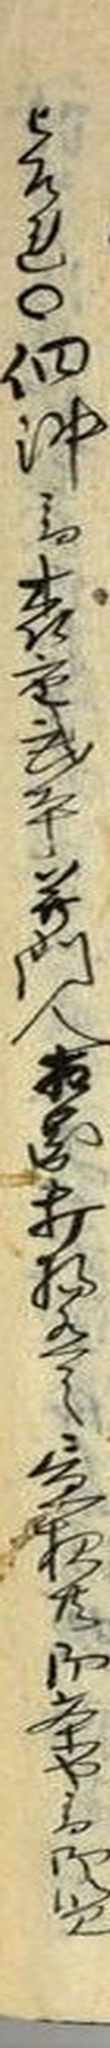被召連○佃沖ニ而森重武平并門人相図打揚有之昼夜共御茶やニ而御覧
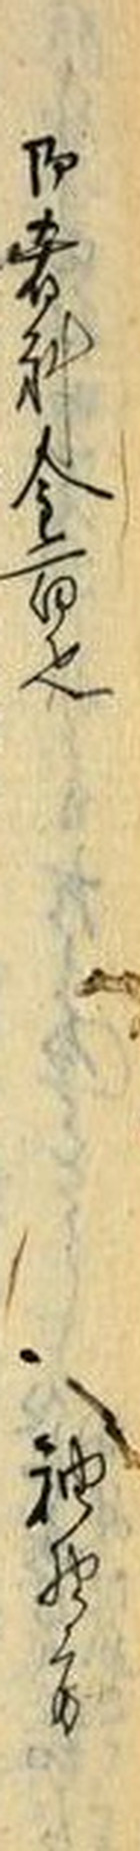御肴料金二百疋袖野方
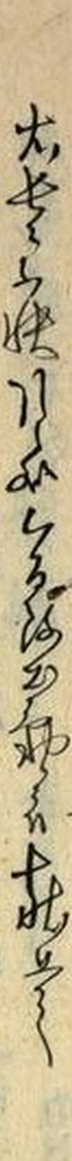右長々不快引候処今日致出勤ニ付献上之
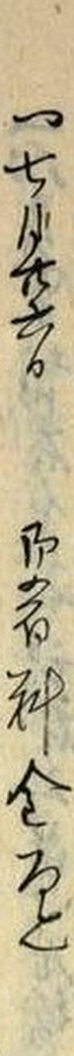一七月廿六日御肴料金百疋
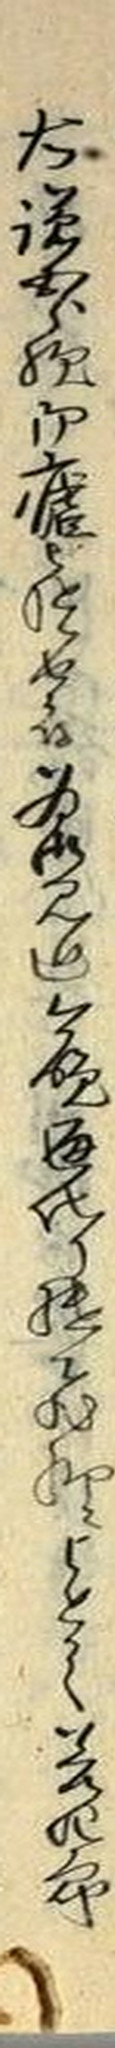右謙五郎様御瘧被遊候由ニ付為御見廻今晩通代り継飛脚ニ被進之善四郎
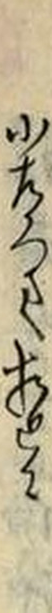小左衛門方へ相廻候
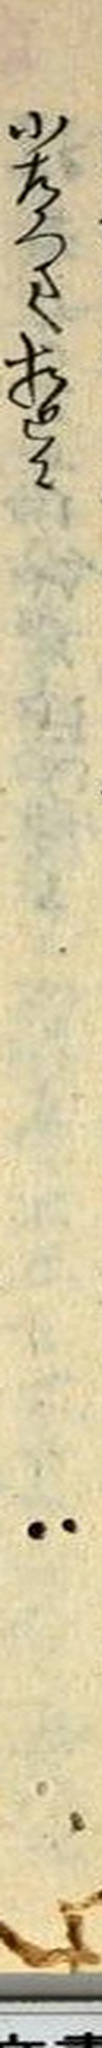小左衛門方へ相廻候
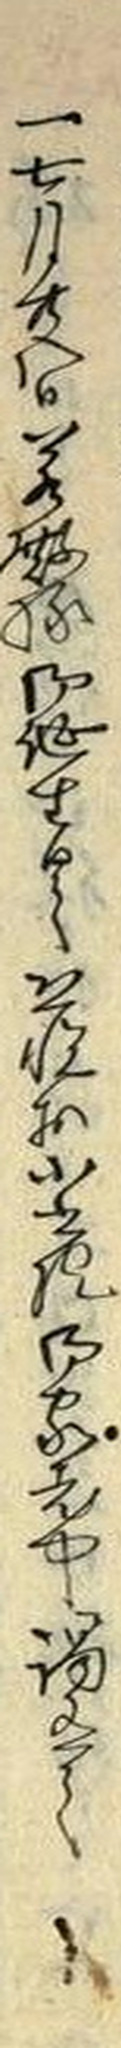一七月廿八日若殿様御誕生日之恐悦於小書院御家老中謁有之
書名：少傅日録抄（斉承付側向頭取日記、在府）
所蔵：福井県文書館 Fukui Prefectural Archives
